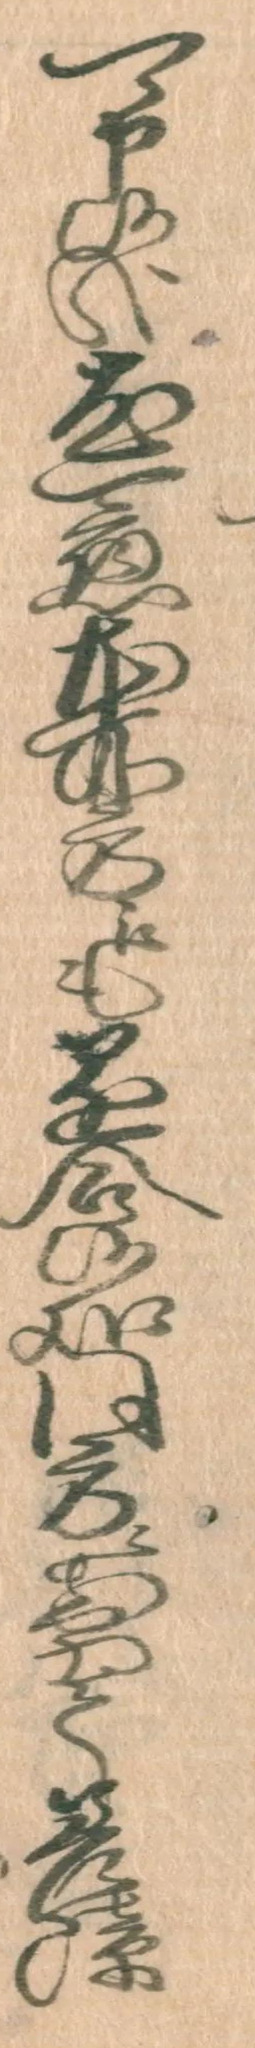可申候哉尤一応本所方江も懸合候処同方ニおゐて差障
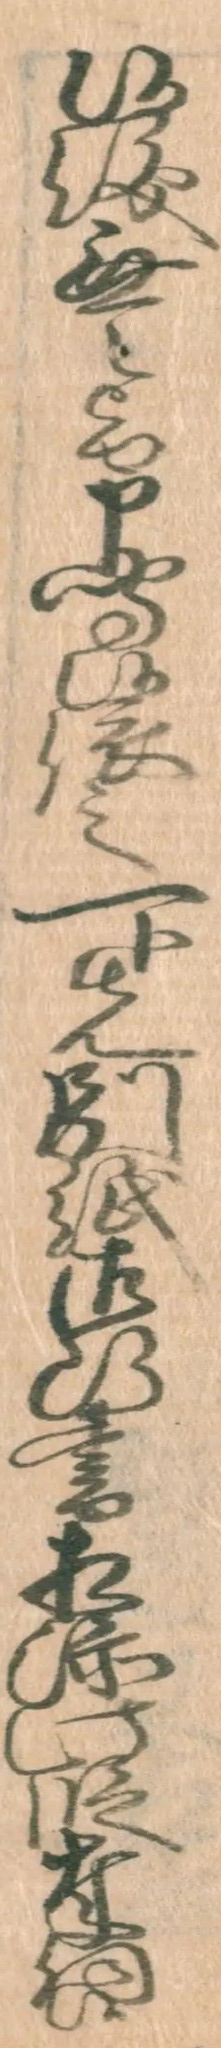候儀内無之旨申聞候依之一ト先別紙御断書相添此段奉伺候
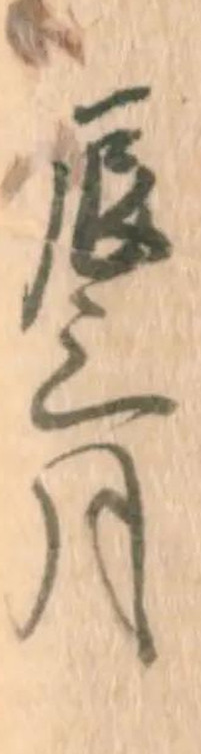辰三月

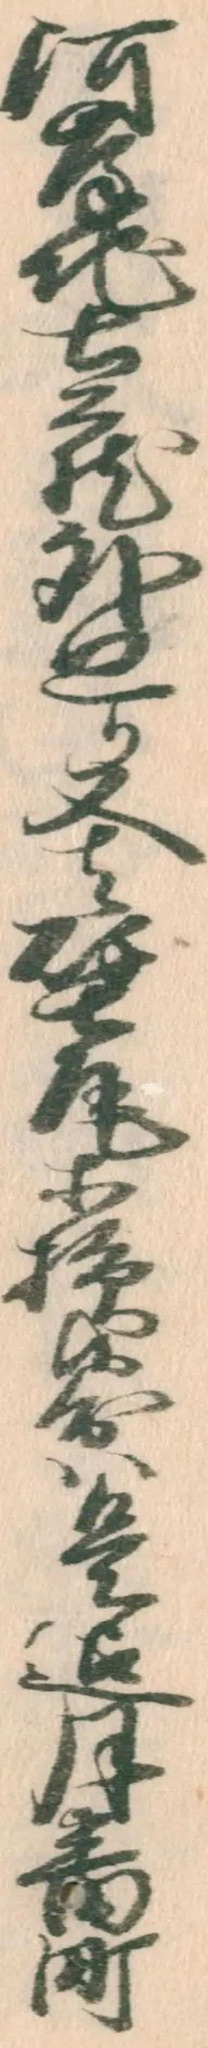河岸地土蔵外廻り又は壁瓦等損候分は是迄月番町
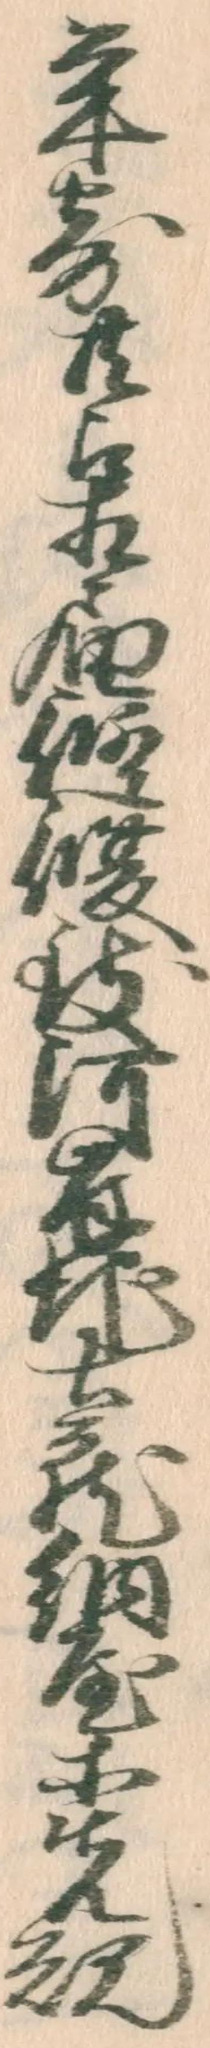年寄共江相届修復致河岸地土蔵納屋等先規
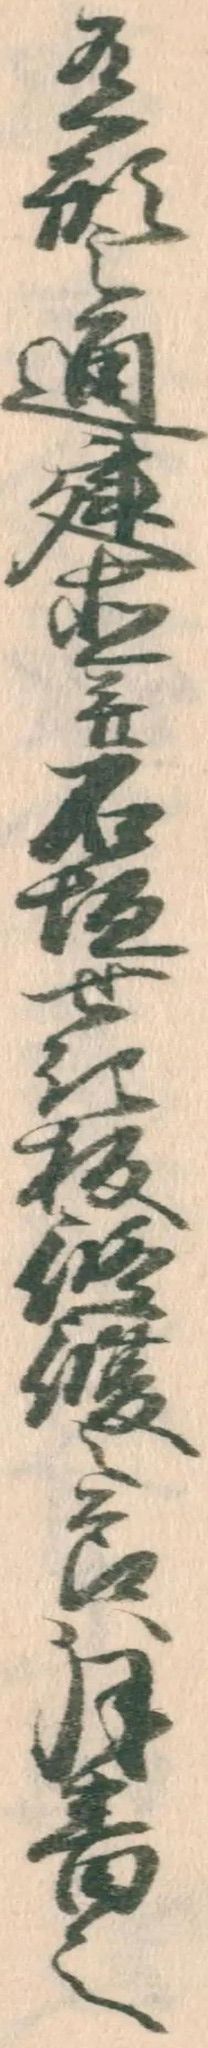有形之通建直并石垣せき板修復之節は月番之
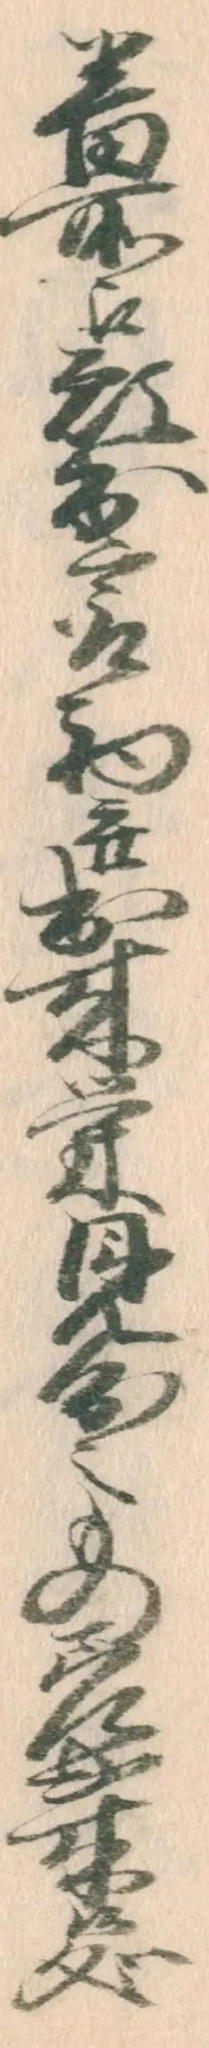番所江願出最初并出来栄見分之もの差出来候処
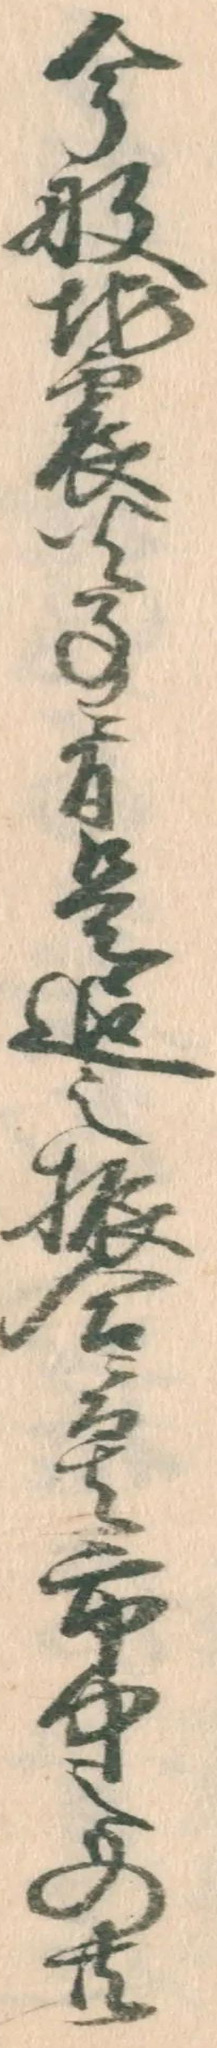今般地震火事ニ付是迄之振合ニ而は市中之もの共

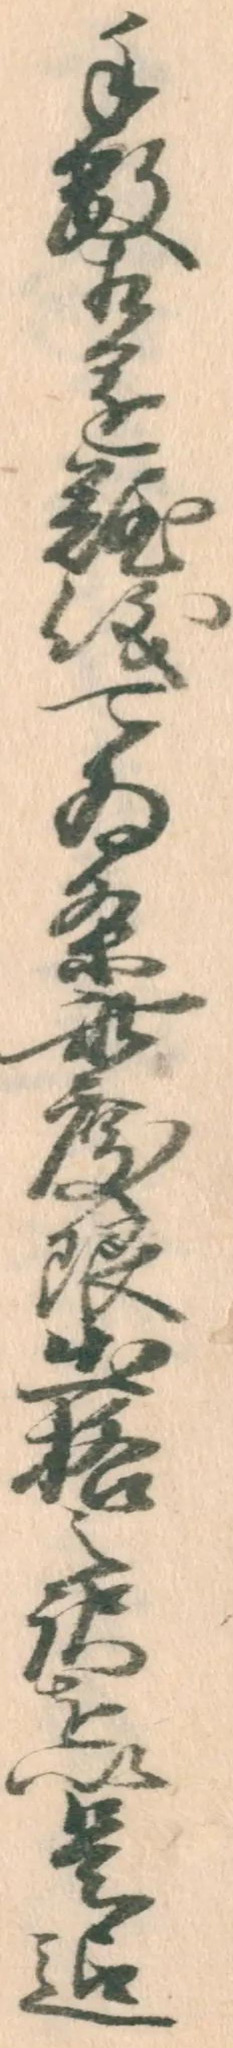手数相懸難儀可為条此度限出格之訳を以是迄
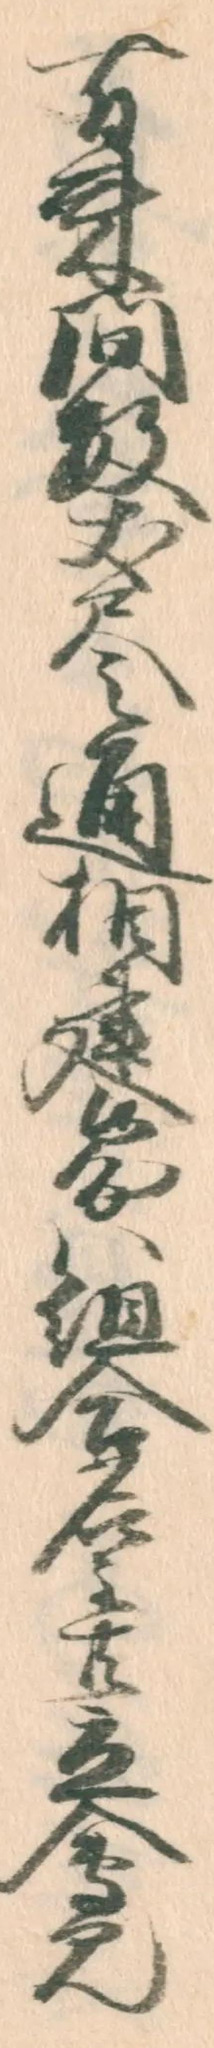有来間数丈尺之通相建候分は組合名主共立会見
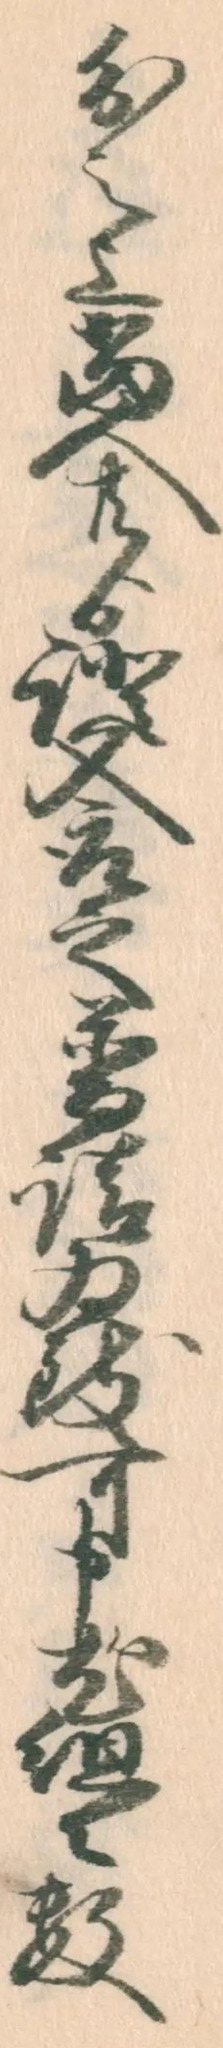分之上当人共ゟ証文取之普請為致可申尤組〻数
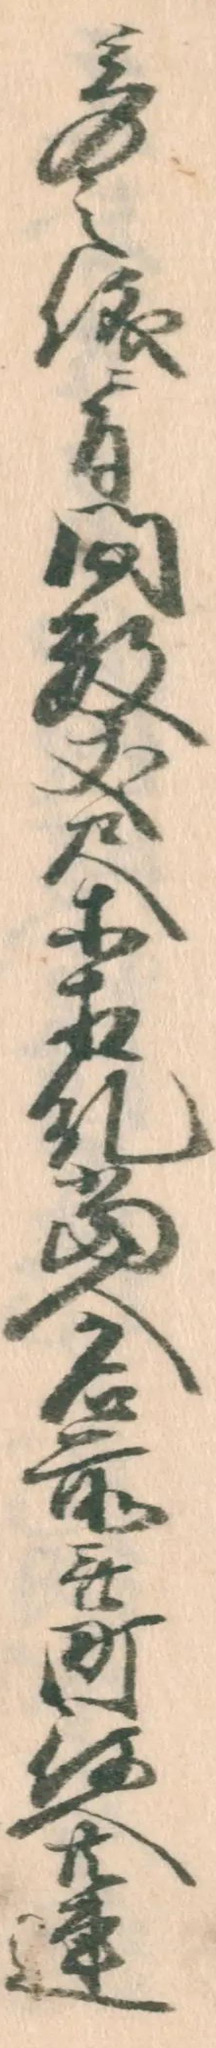多之儀ニ付間数丈尺等相糺当人名前并町役人共連
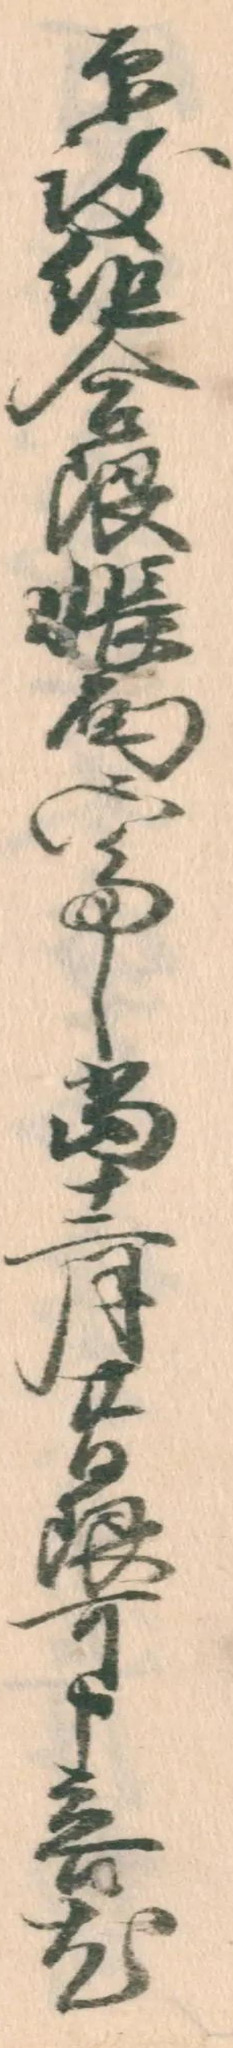印致組合限帳面ニいたし当十二月廿日限可申立候尤
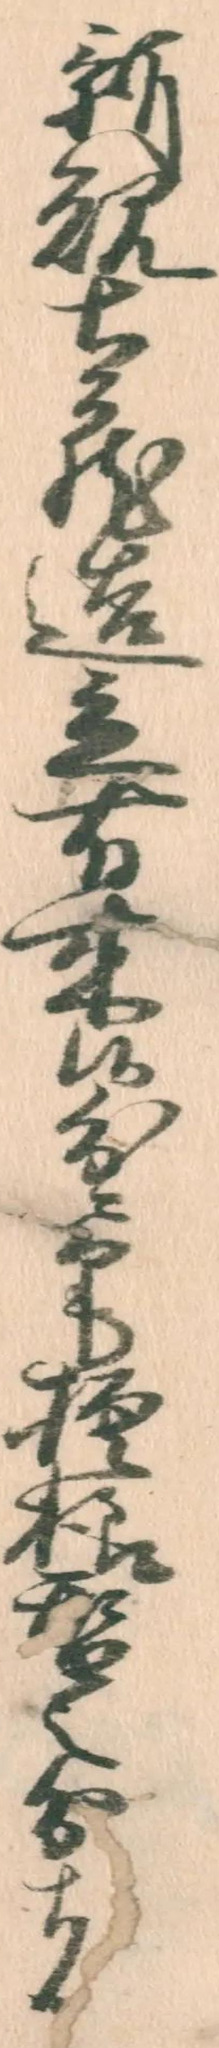新規土蔵造立有来候分ニ而も模様替之分は
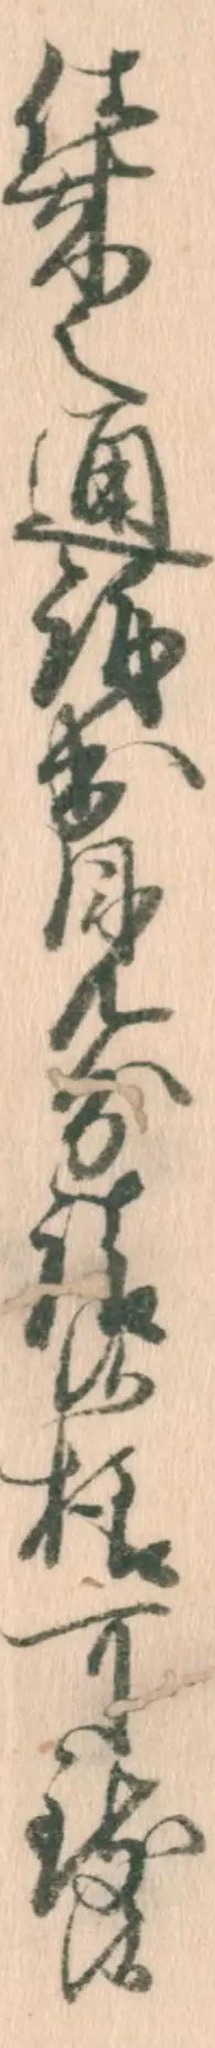仕来之通訴出見分請候様可致候
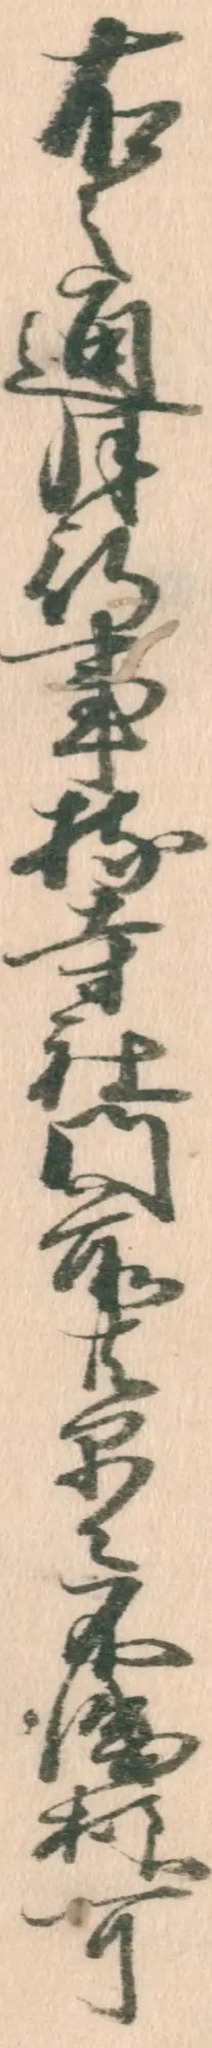右之通月行事持寺社門前共早〻不洩様可
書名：地震災書留 2巻. [1] 内表紙に「地震災書留　安政二卯年　但本所深川御用屋敷地代免除調」とあり
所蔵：国立国会図書館 National Diet Library, JAPAN
